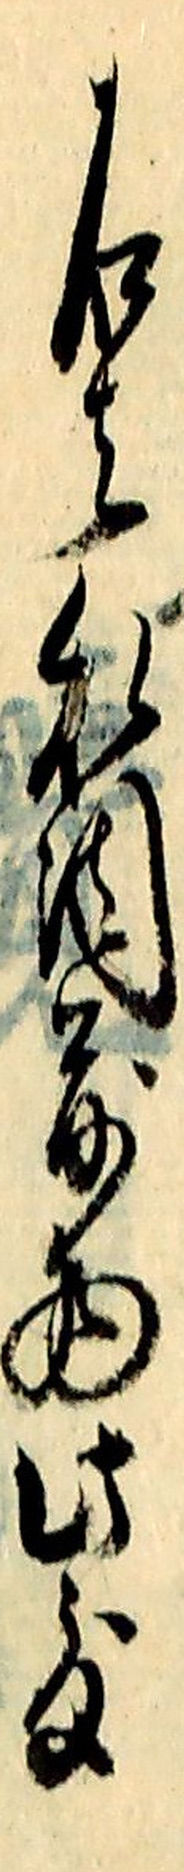右は私調荷物此度
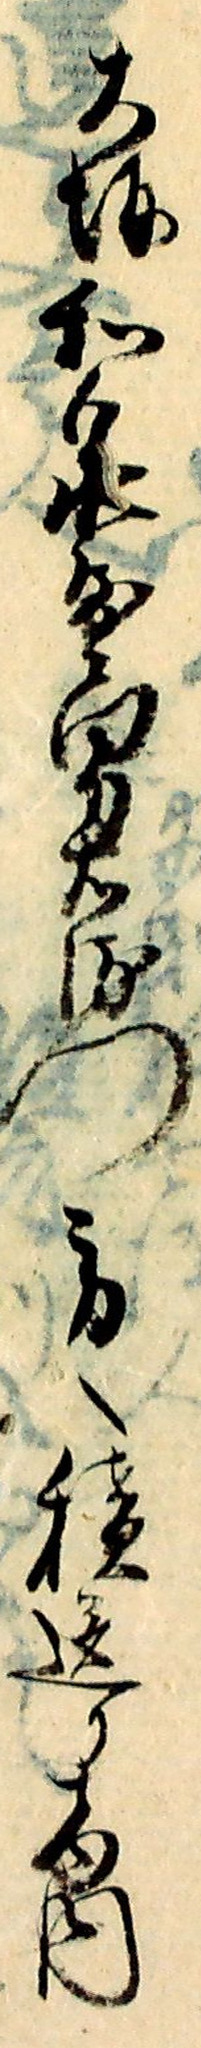大坂和泉屋勇右衛門方へ積送り商内
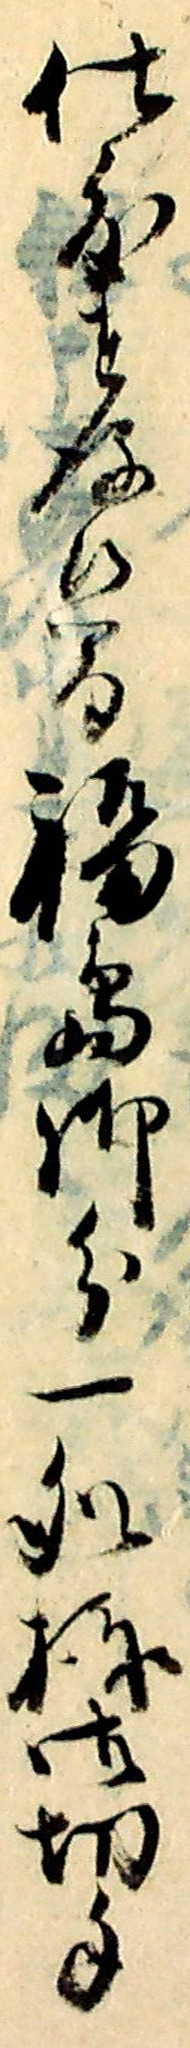仕度奉存候間福島御分一処様御切手
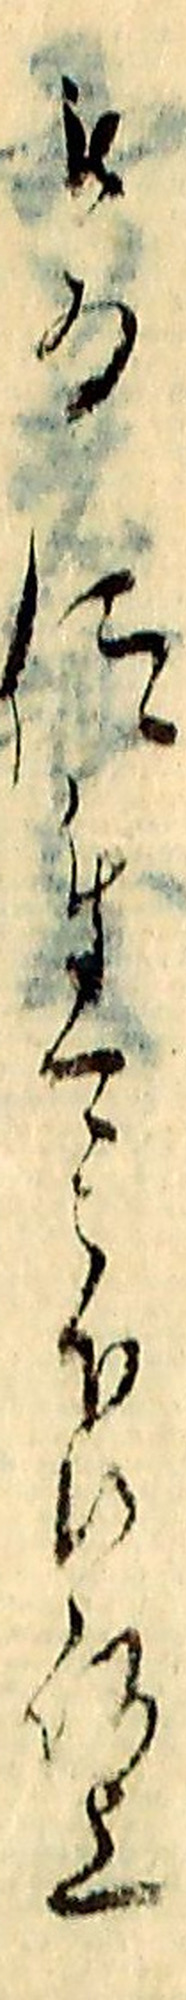被為仰付可被下候以上
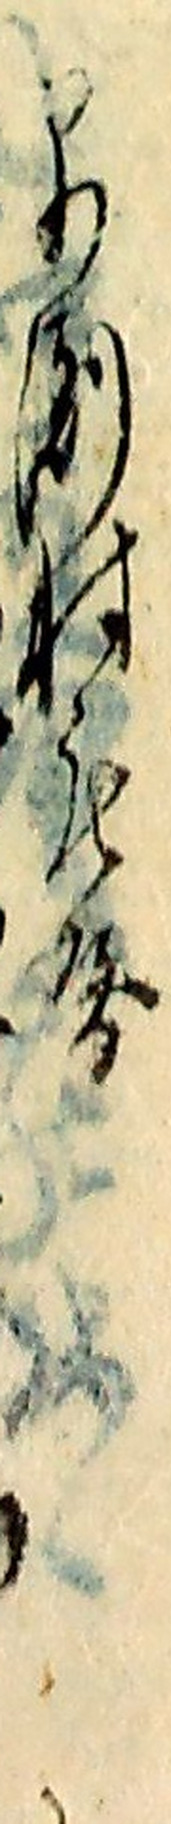早淵村庄屋
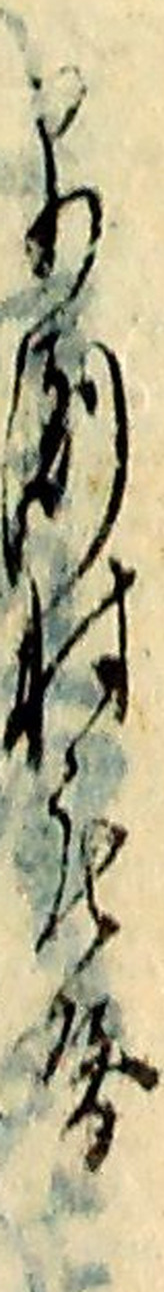早淵村庄屋
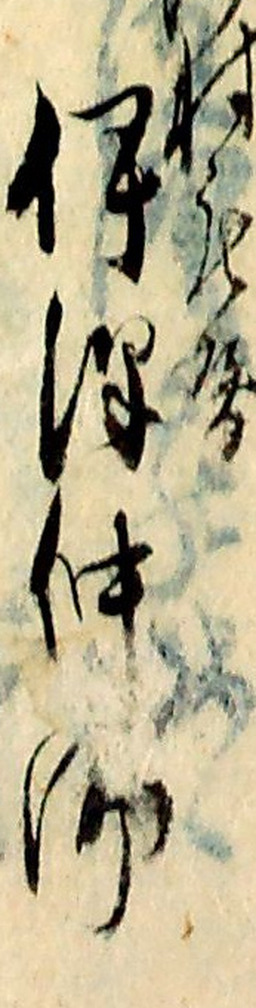伊沢仲助
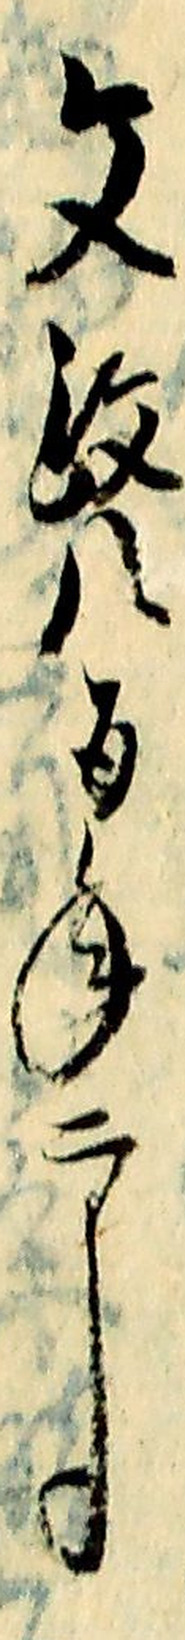文政八酉年二月
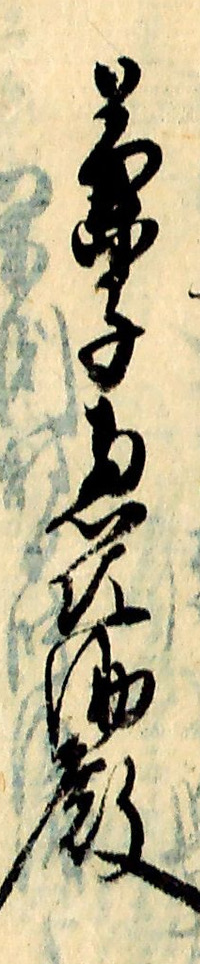兼子恵次助殿

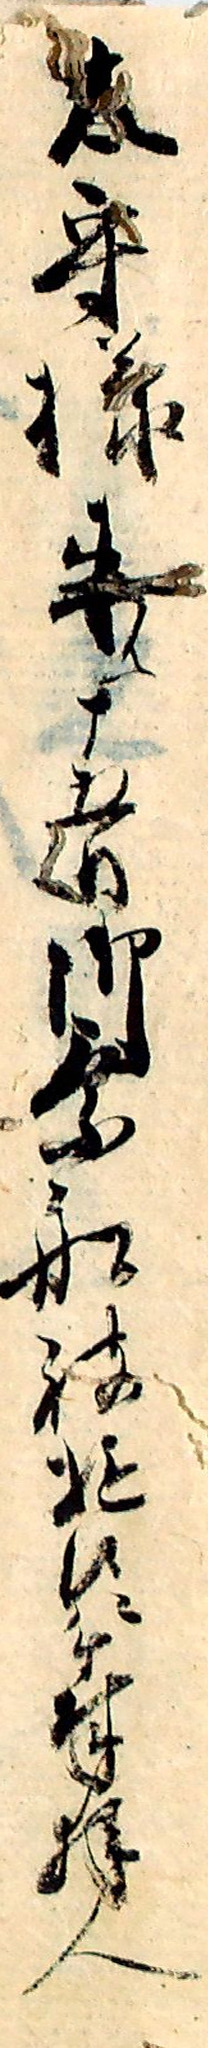太守様来る十五日御乗船被遊候に付奉拝人
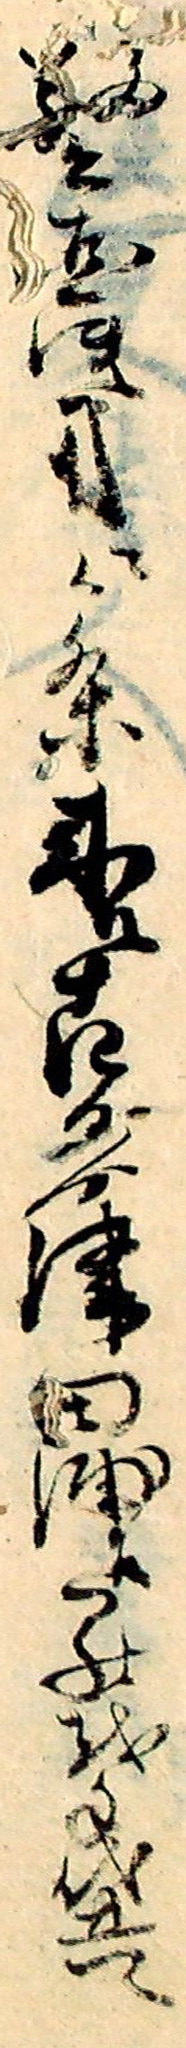警固御用に候条来る十四日ゟ津田浦え罷越手代共へ
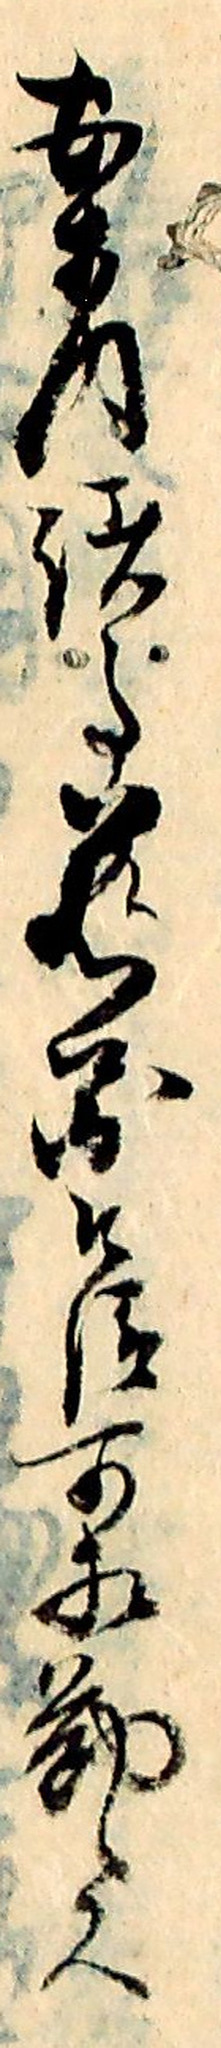案内諸事差図被請可相勤候以上
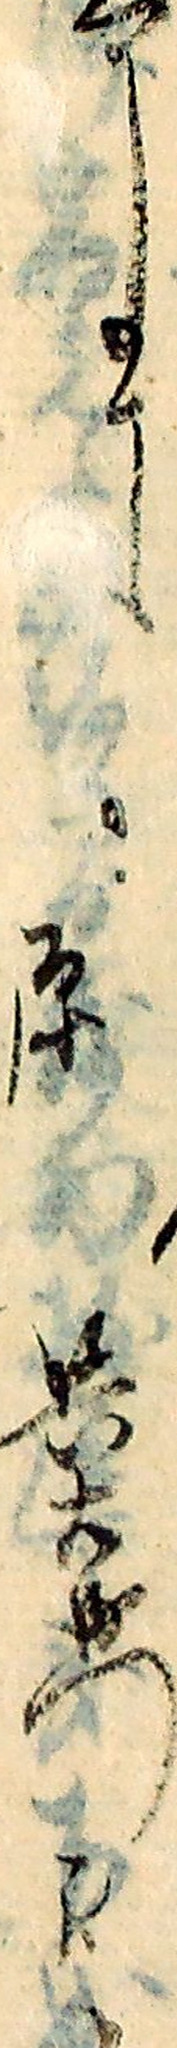原与右衛門印
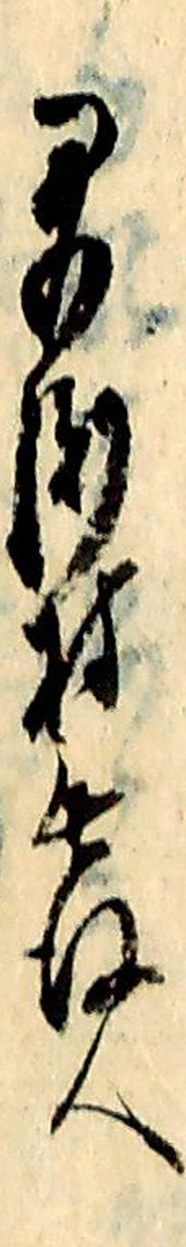早淵村無役人
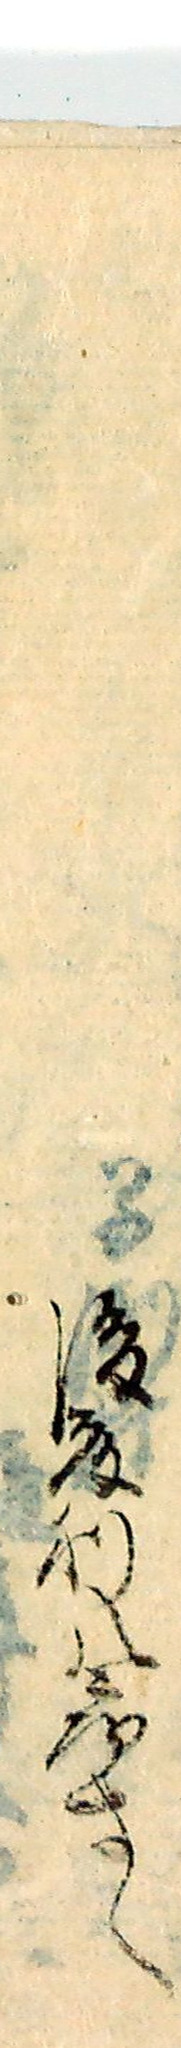後藤利八郎方へ
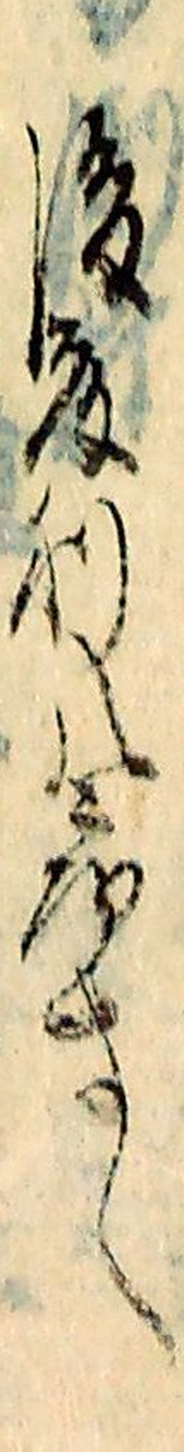後藤利八郎方へ
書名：諸御願書控(後藤氏壱番）
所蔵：鳴門教育大学 Naruto University of Education
